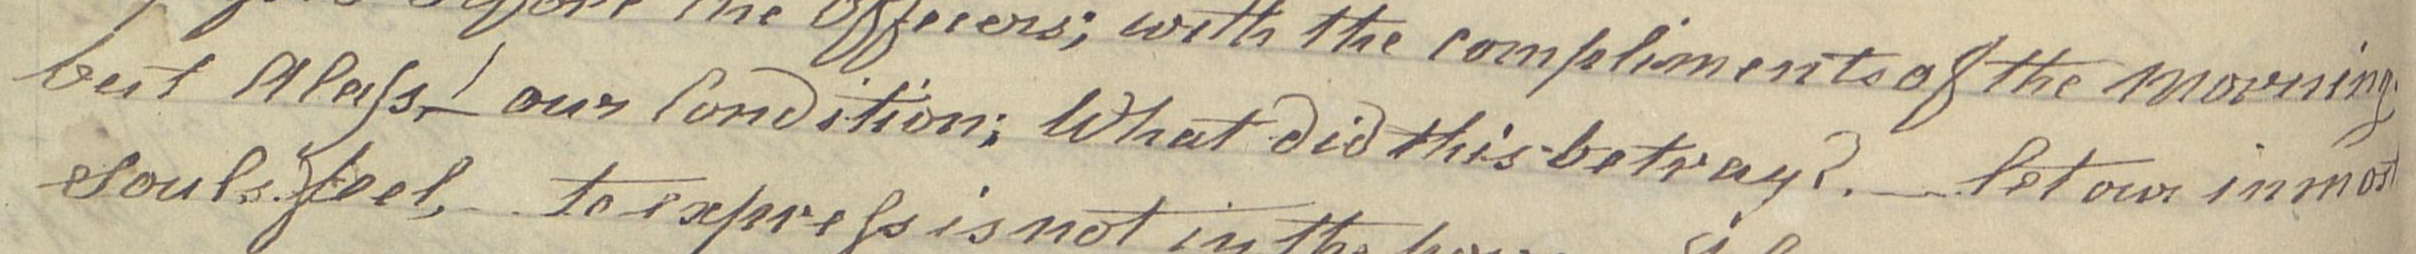but pleas, our Condition; what did this betray? let our inmost
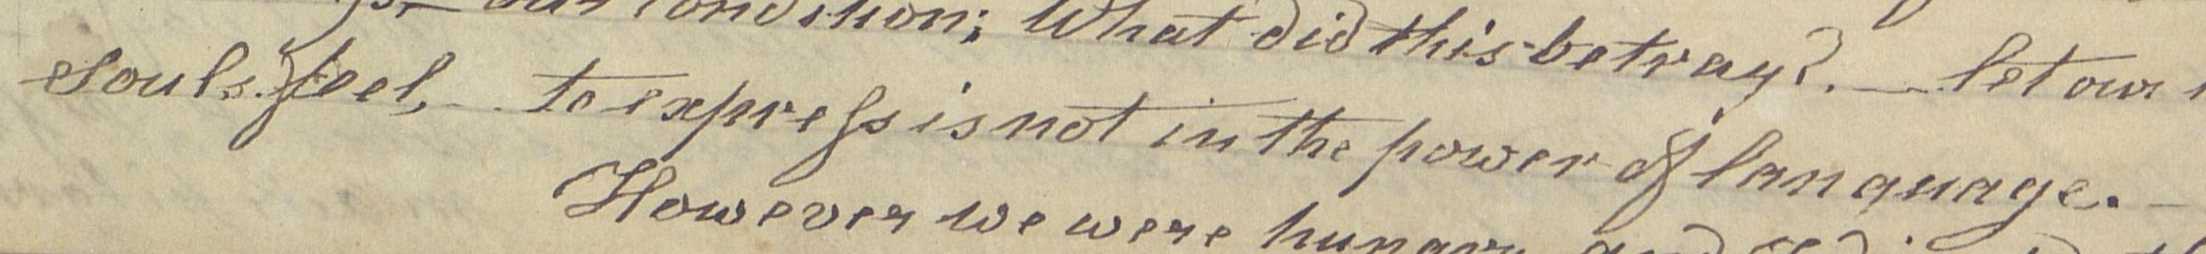souls feel, to express is not in the power of language.
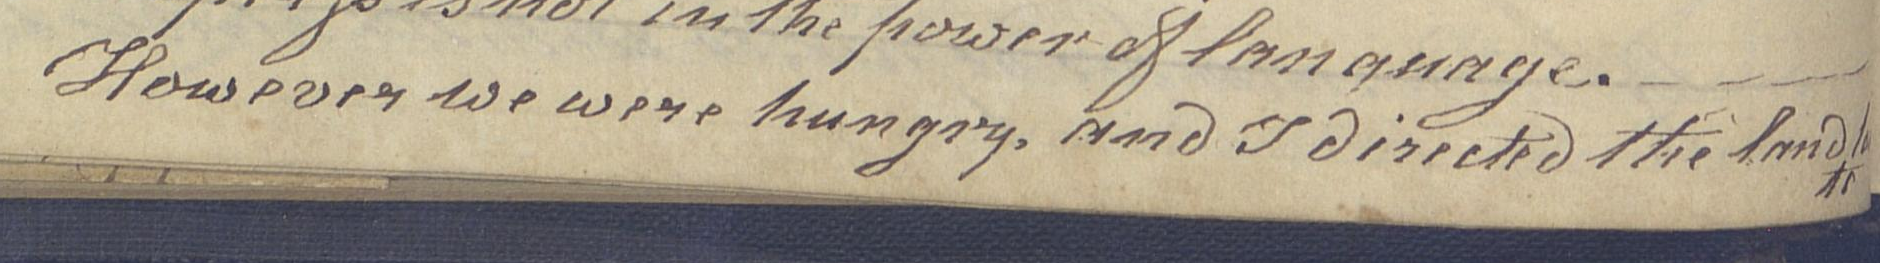However we were hungry, and I directed the land
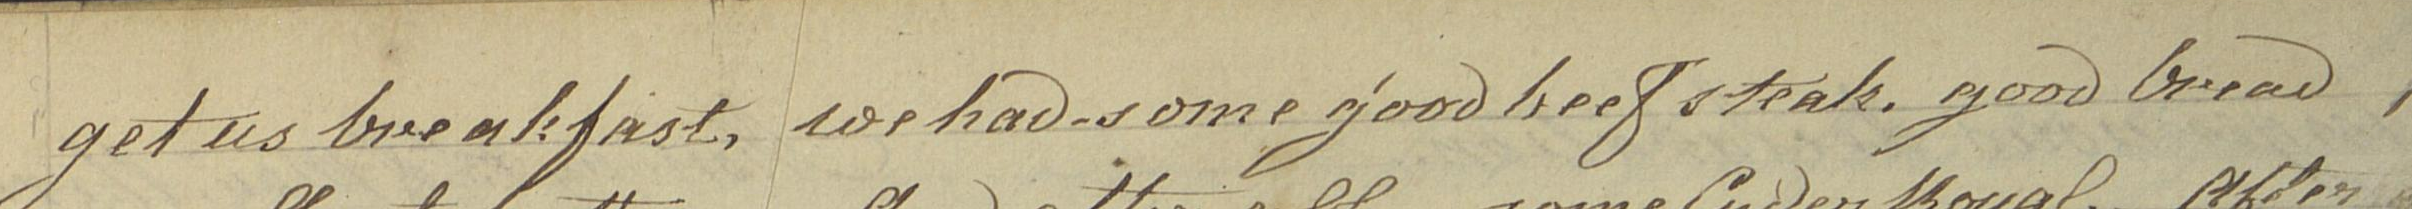get us breakfast, we had some good beef steak good bread
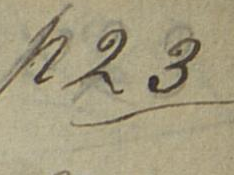p 23
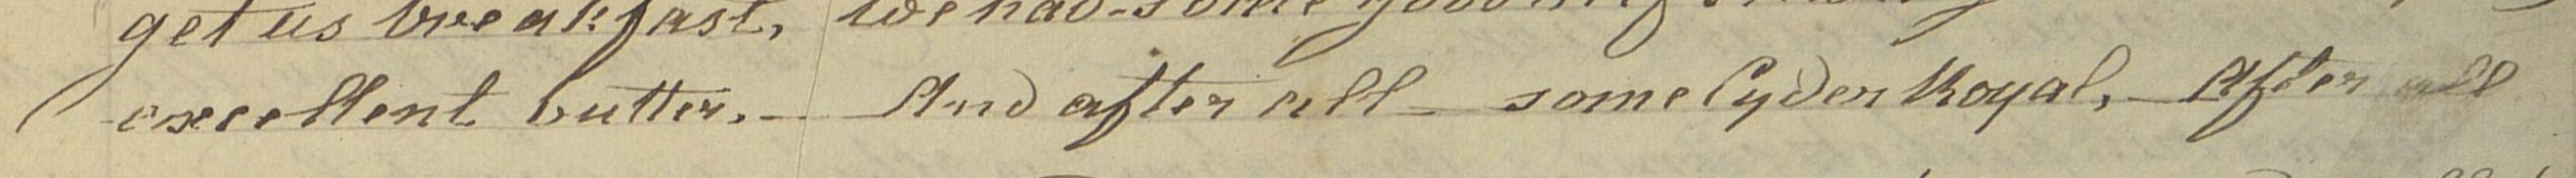excellent butter, And after all some Cyder Royal, After all
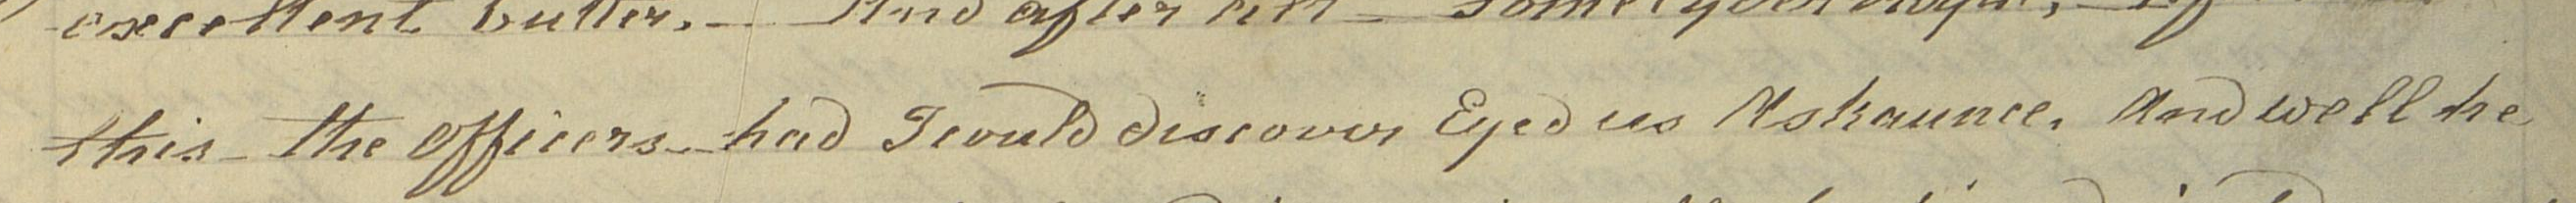this the officers had I could discover Eyed us askance, and well he
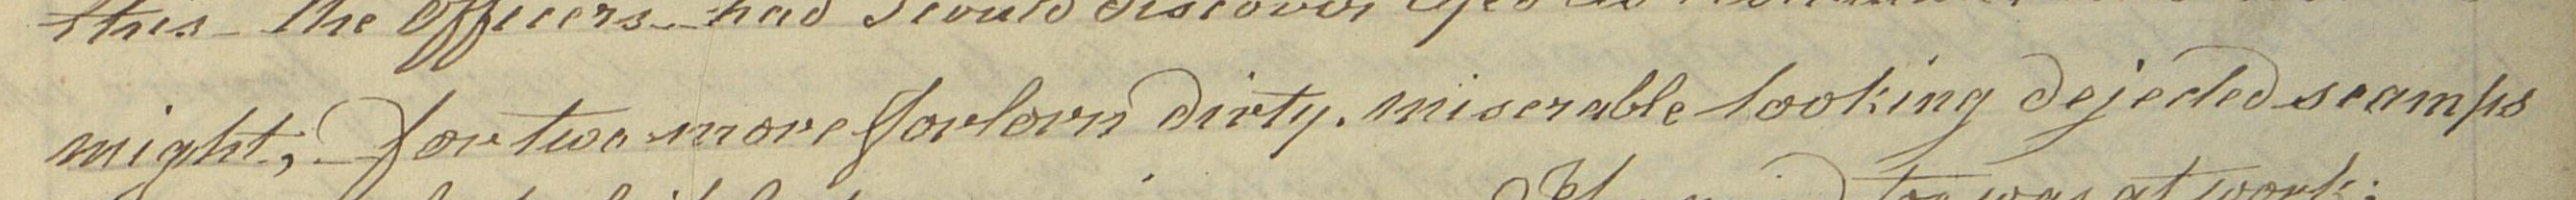might, for two more forlorn dirty, miserable looking dejected seamless
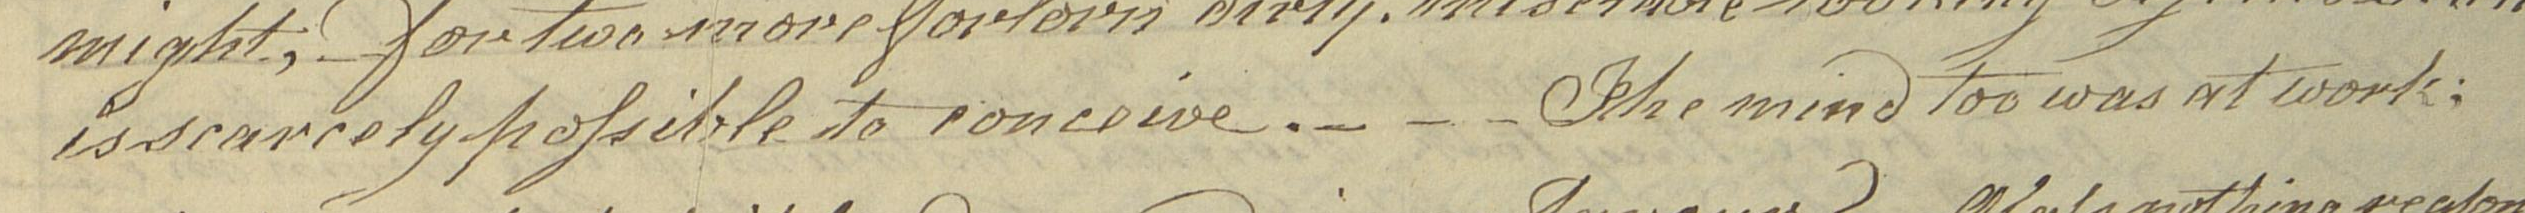is scarcely possible to conceive. The mind too was at work:
